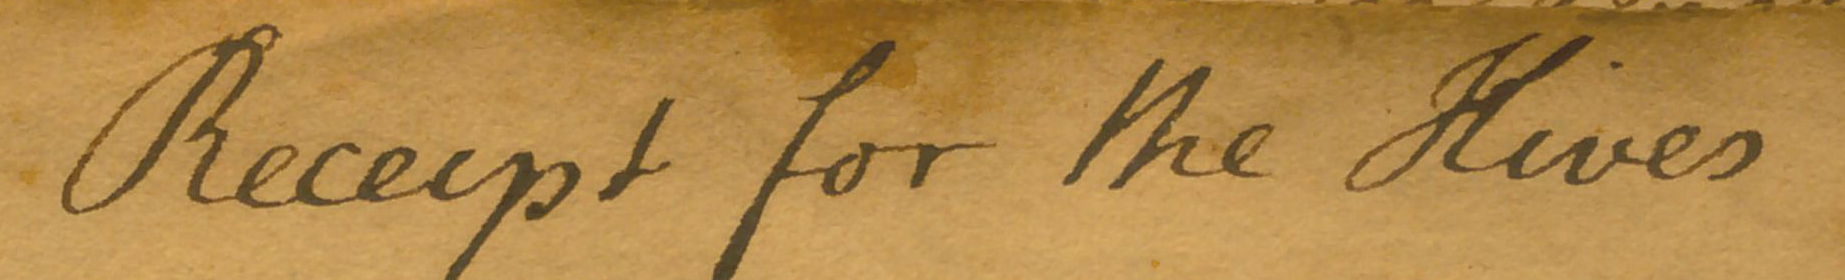Receipt for the Hives
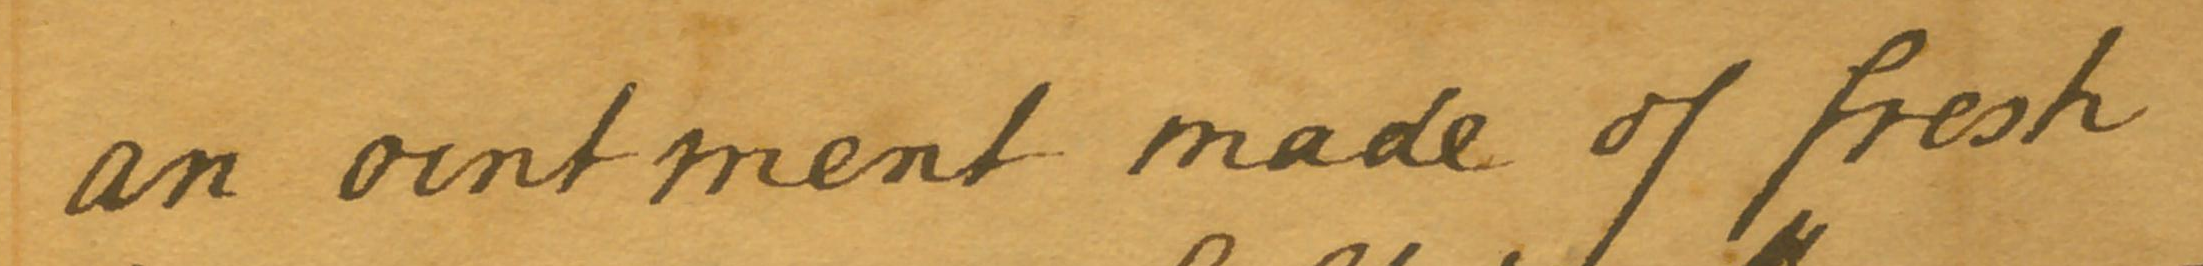an ointment made of fresh
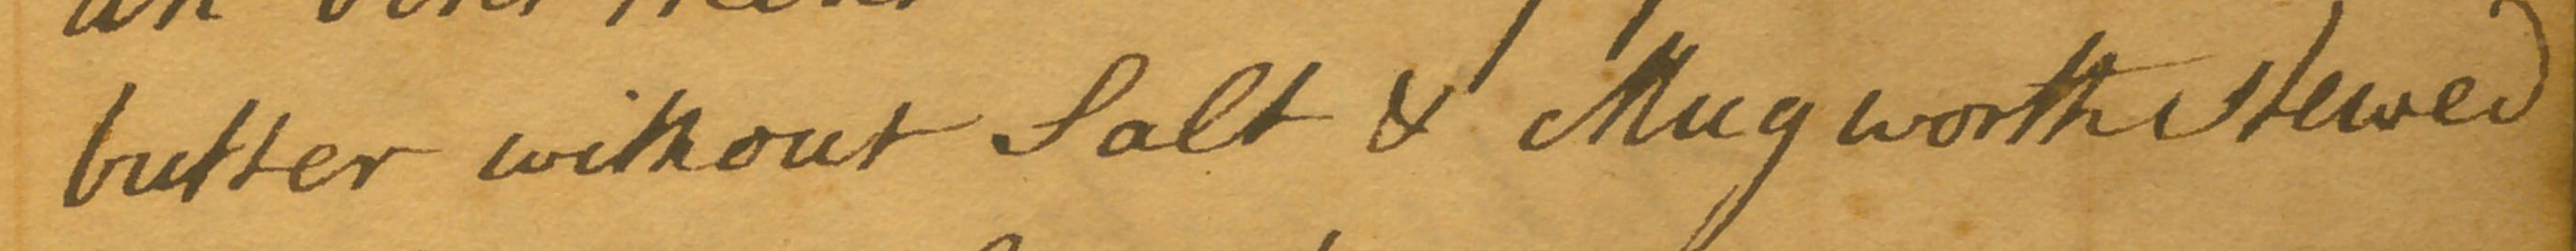butter without salt & Mugworth stewed
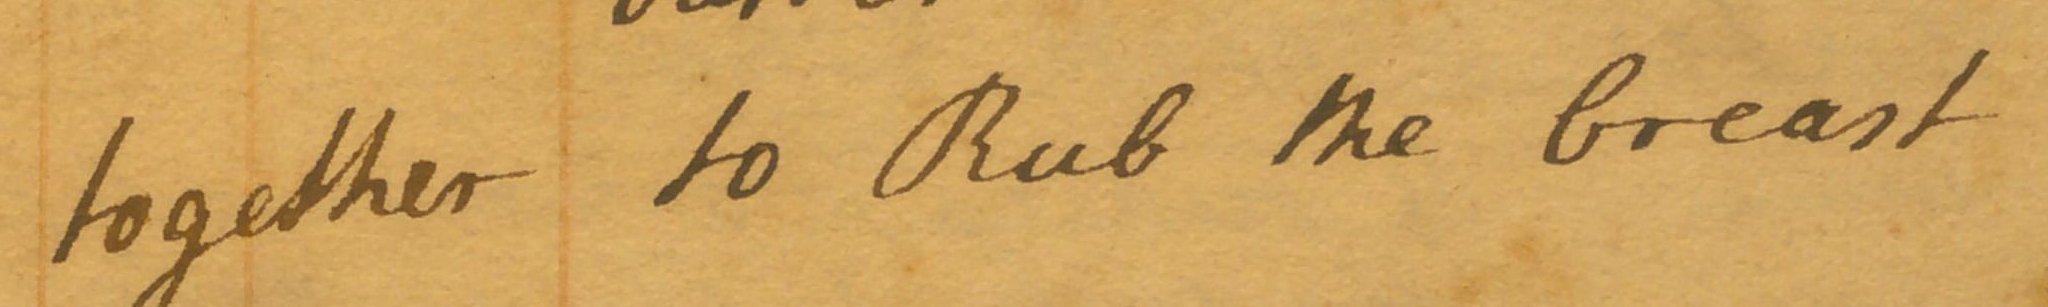together to Rub the breast
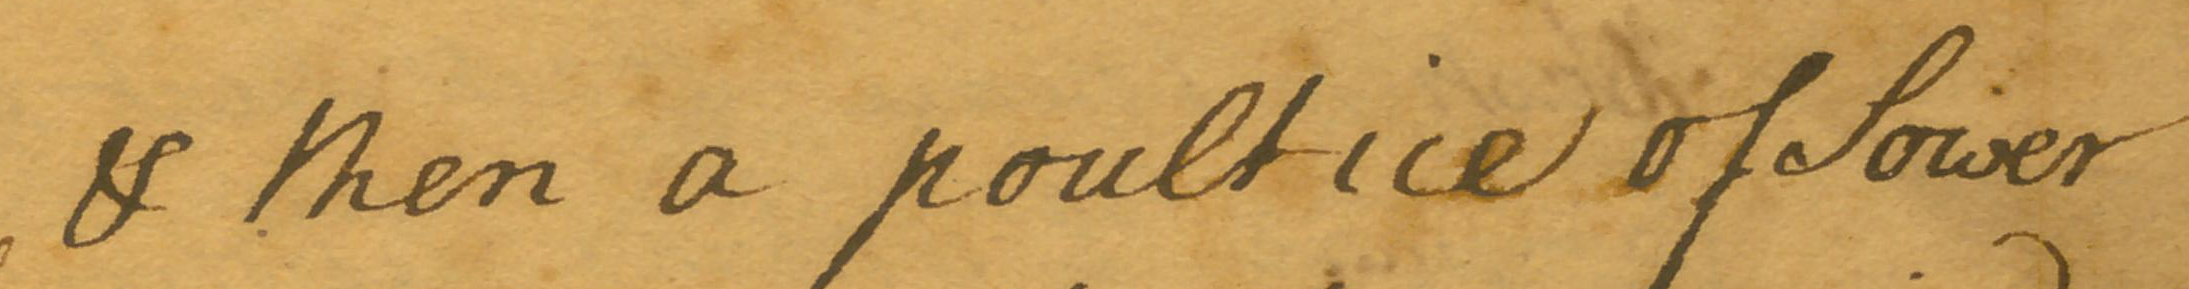& then a poultice of Sower
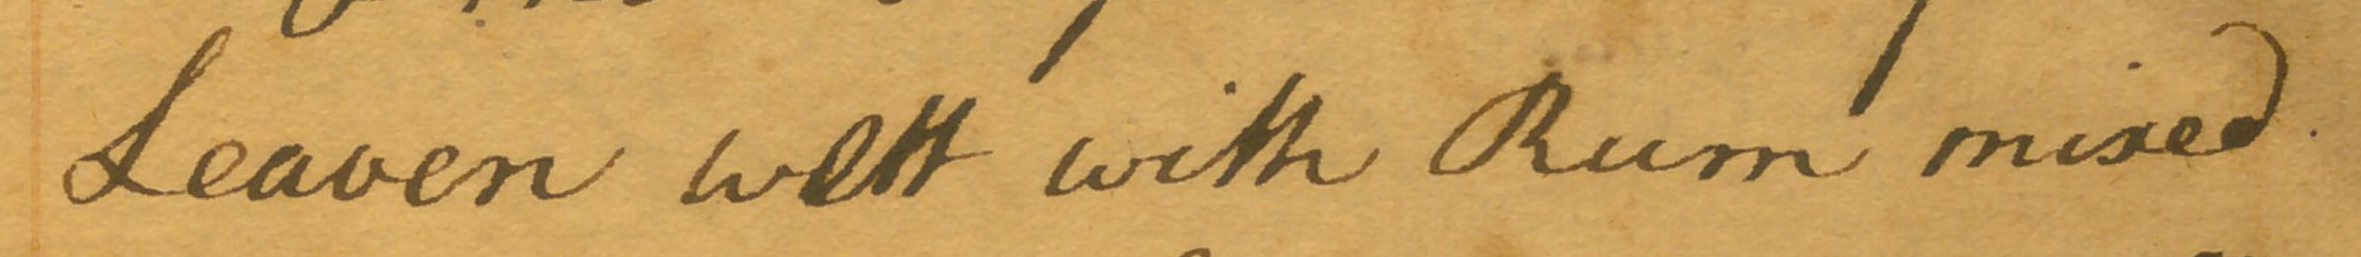Leaven welt with Rum mixed
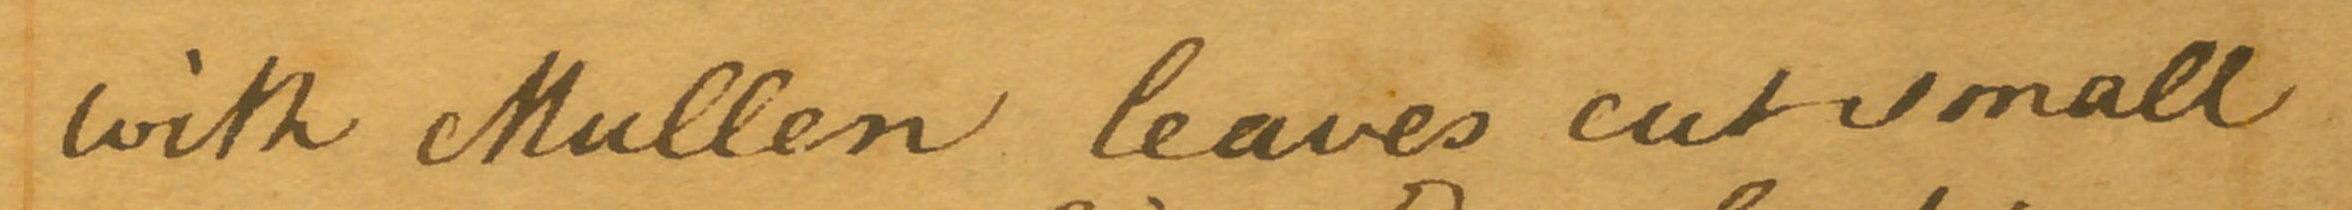with Mullen leaves cut small
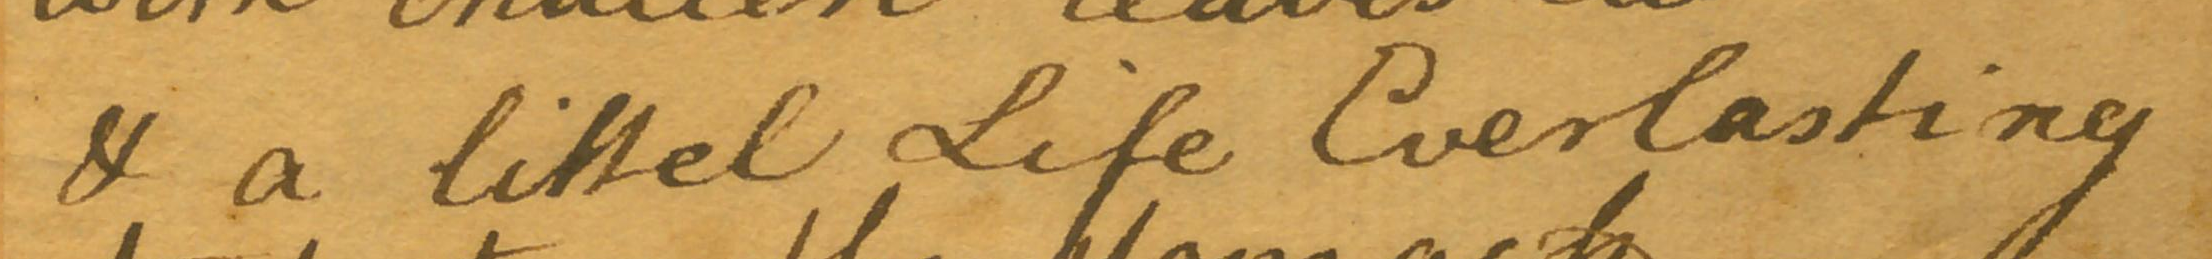& a littel Life Everlasting
